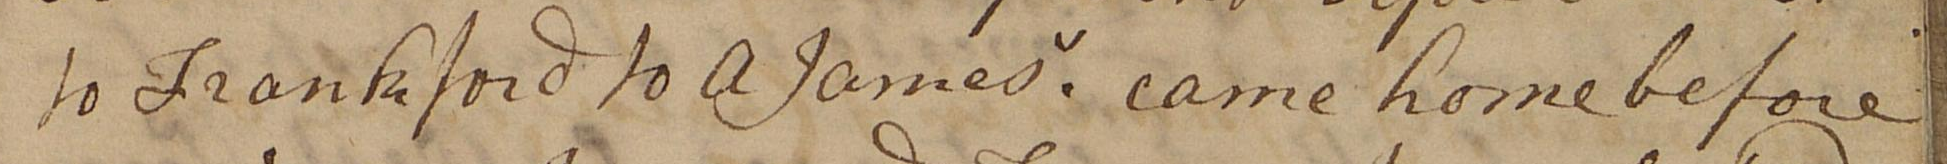to Frankford to A James^s. came home before
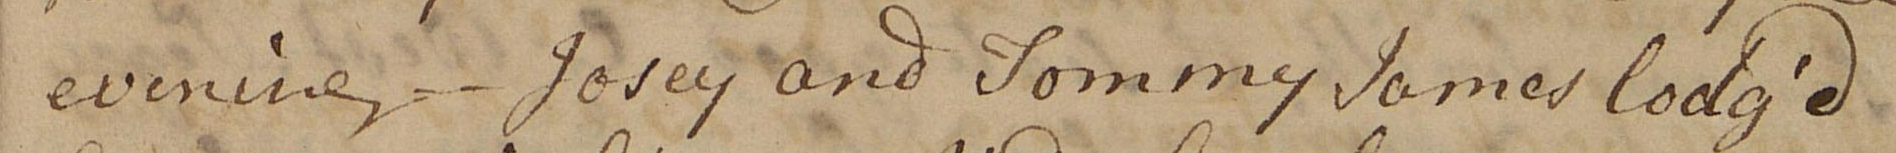evening,- Josey and Tommy James lodg'd
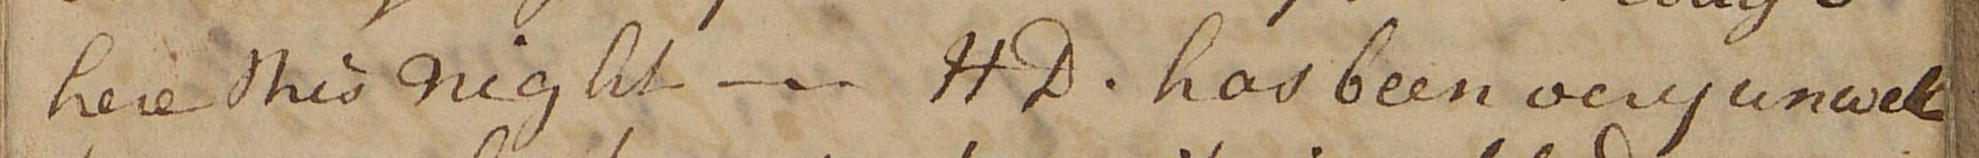here this Night-- HD. has been very unwell
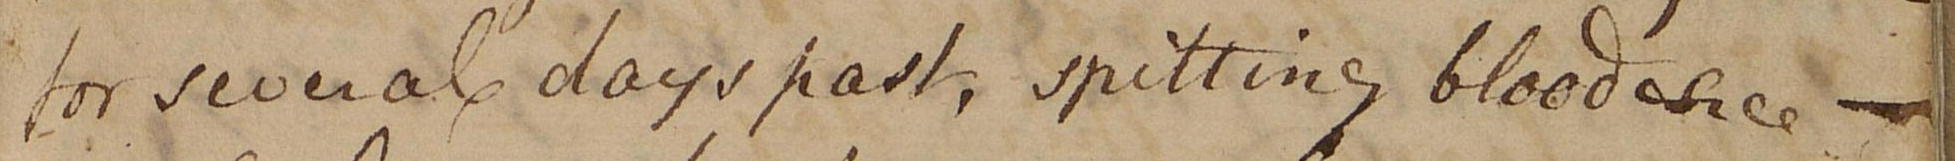for several days past, spitting blood &c-
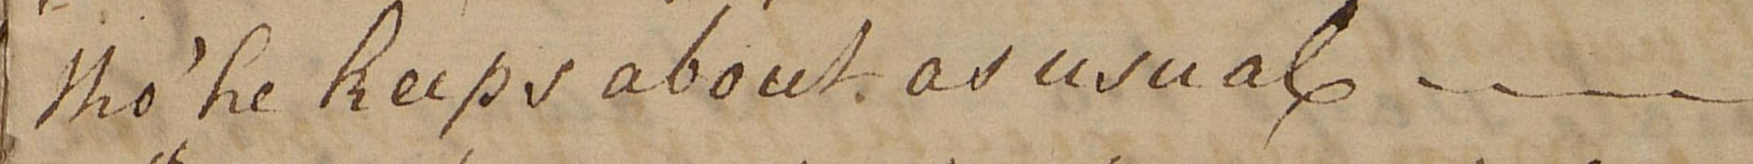tho' he keeps about as usual--
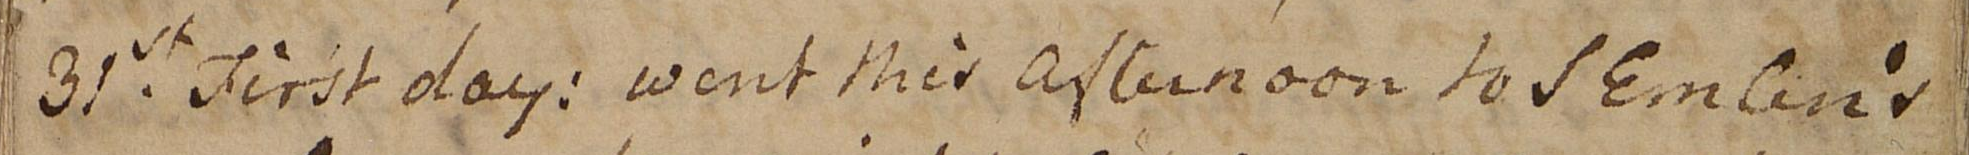31^st. First day: went this afternoon to S Emlen's
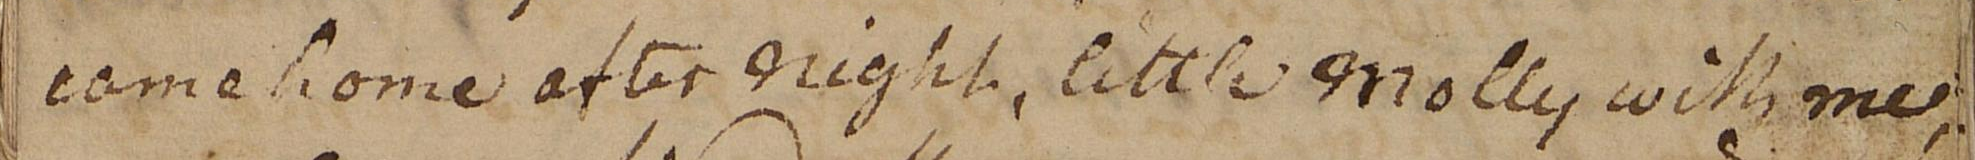came home after night, little Molly with me
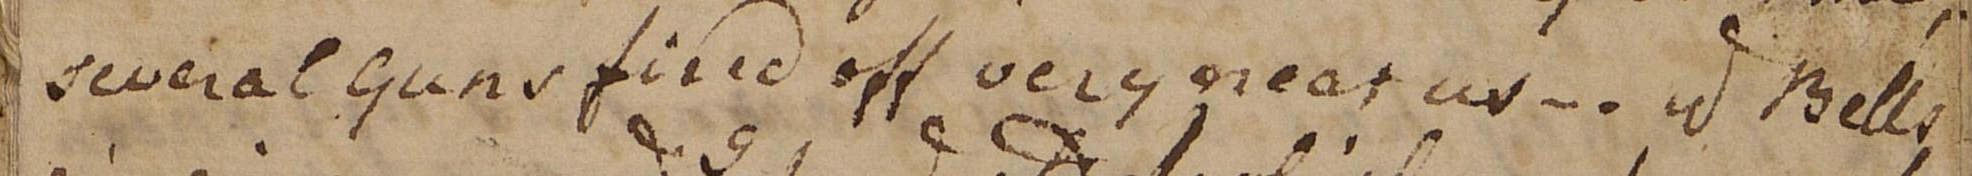several Guns fired off very near us- y^e Bells
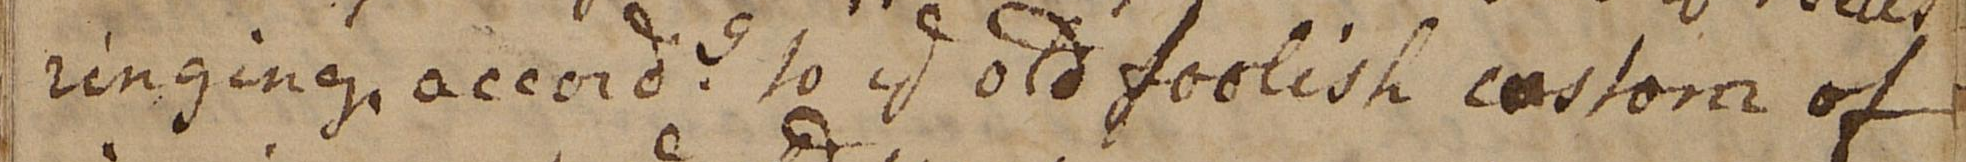ringing accord^g. to y^e old foolish custom of
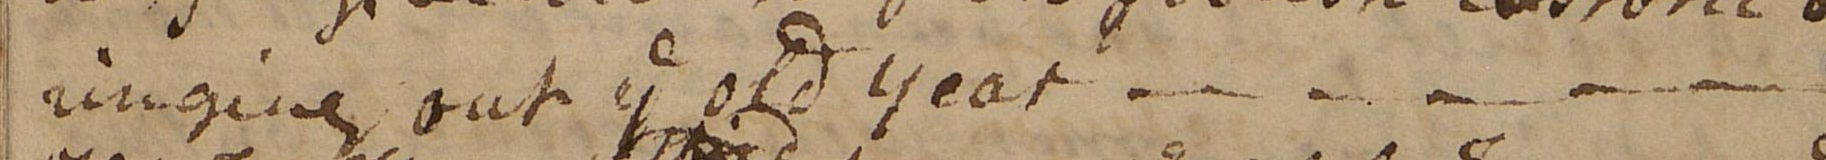ringing out y^E old year-- --
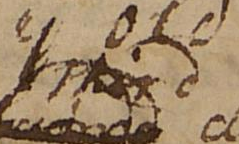third
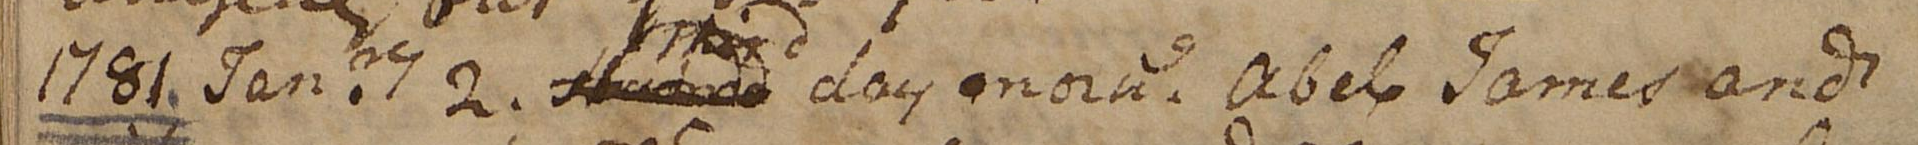1781 Jan^ry. 2. [second] day morn^g. Abel James and
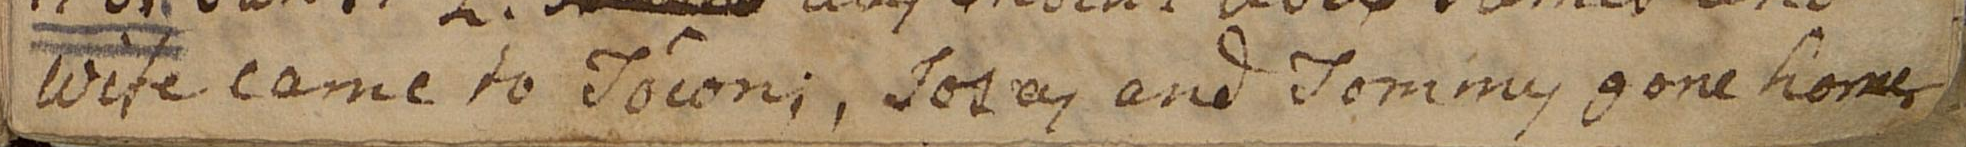wife came to Town; Josey and Tommy gone home
